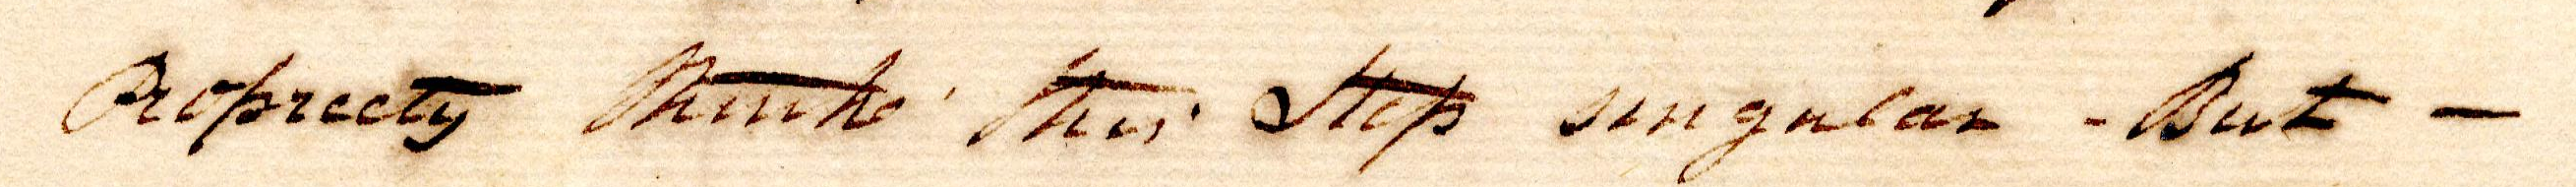Propriety think this Step singular. But
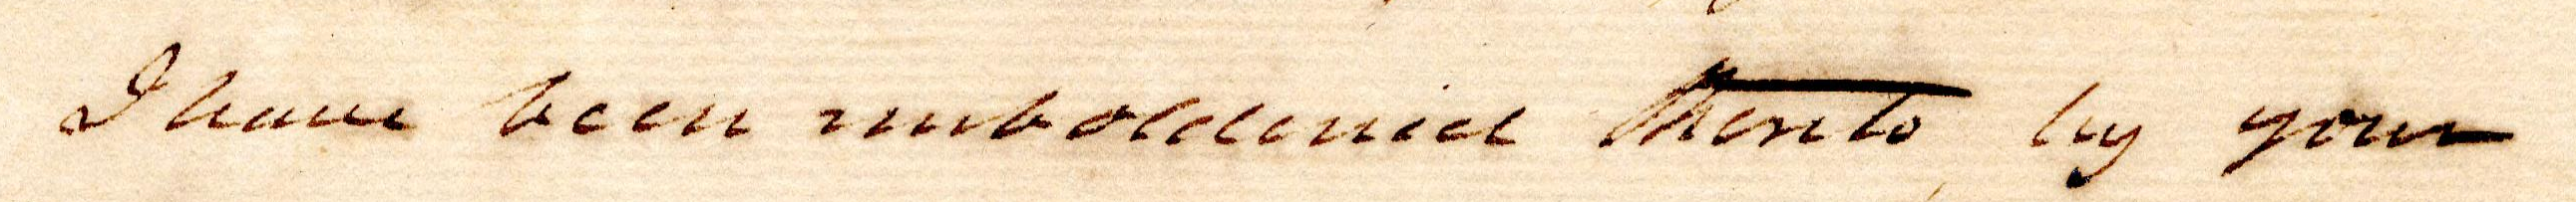I have been emboldened then to by your
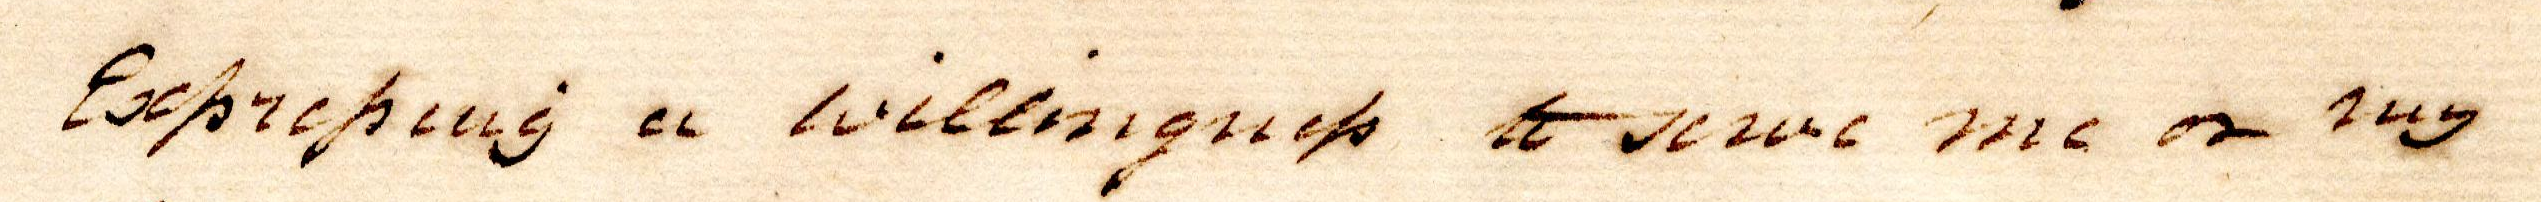Expressing a willingness to serve me or my
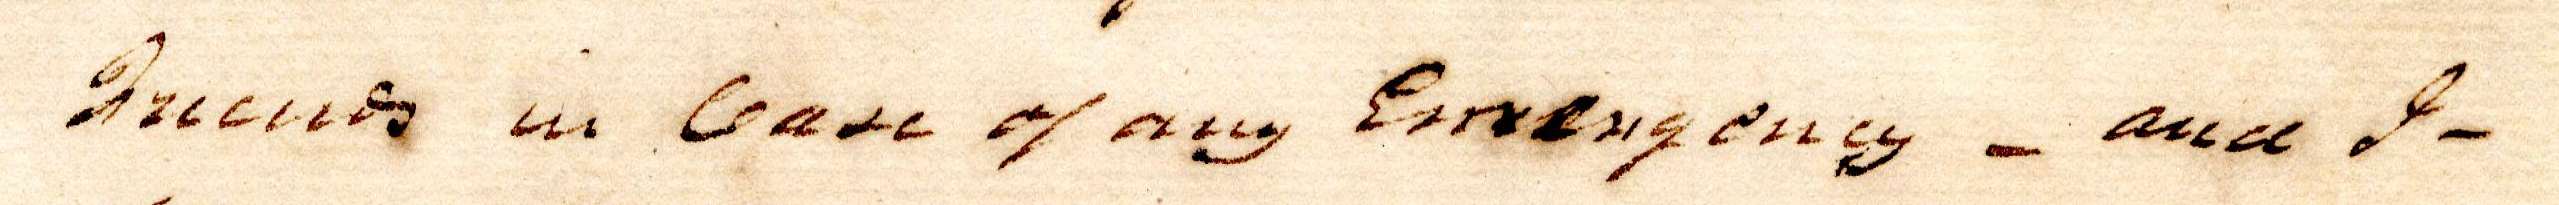Friends in Case of any Emergency, and I
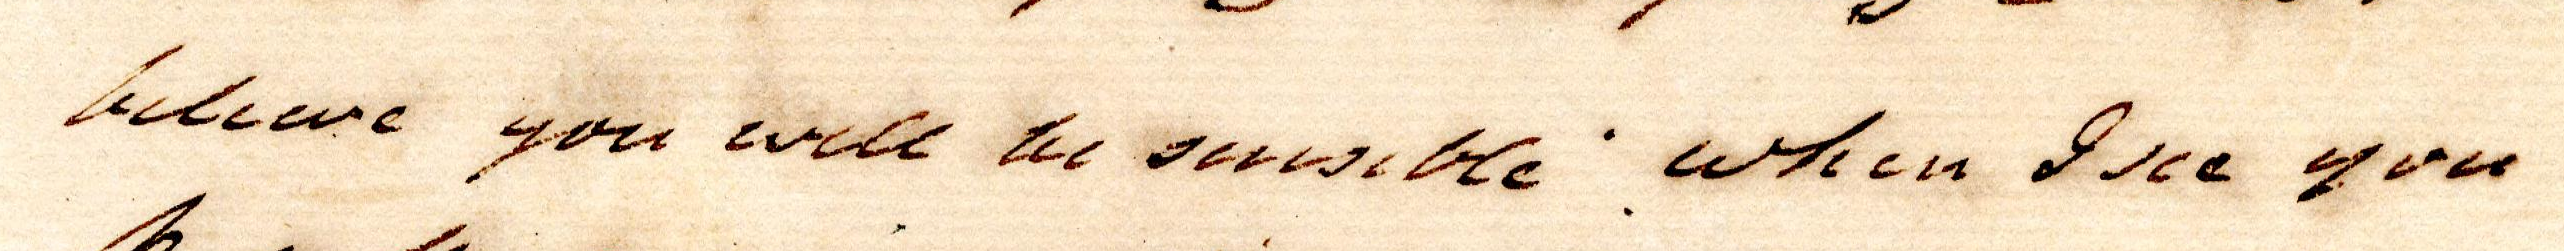believe you will be sensible when I see you
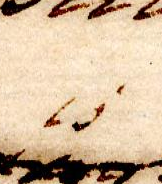is
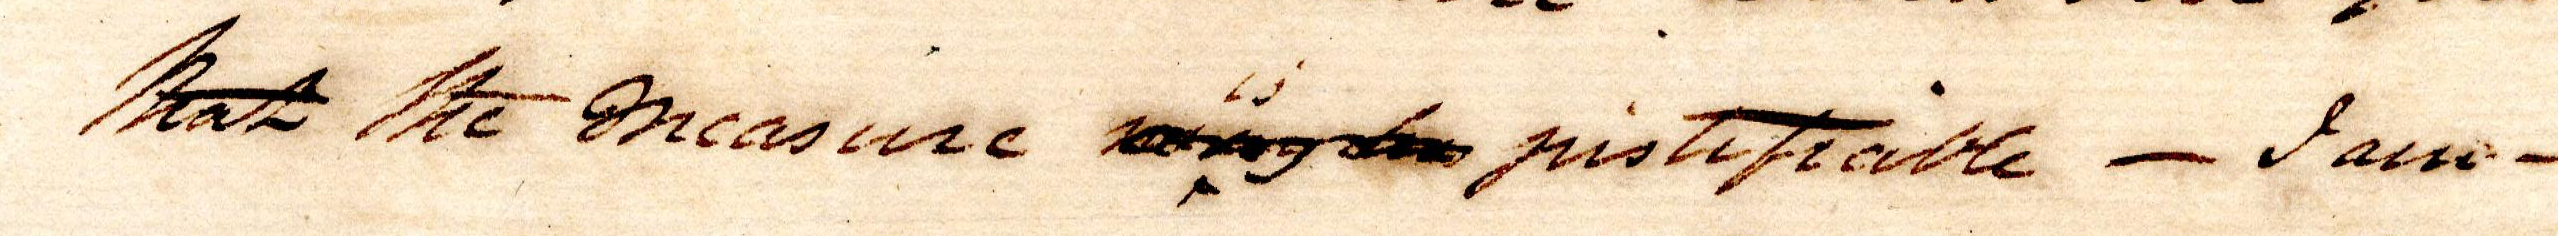that he measure ^ [may be] justifiable. I am
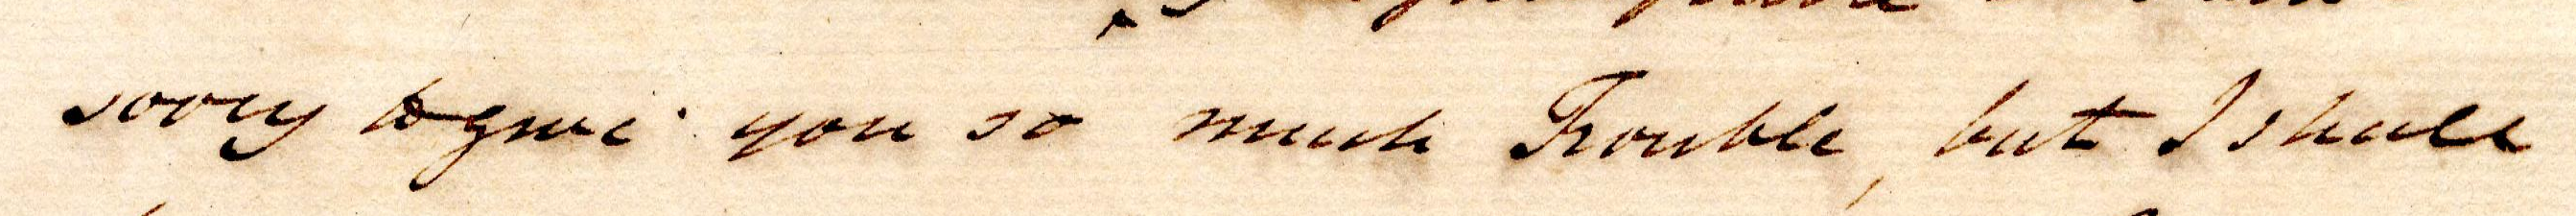sorry to give you so much Trouble, but I shall
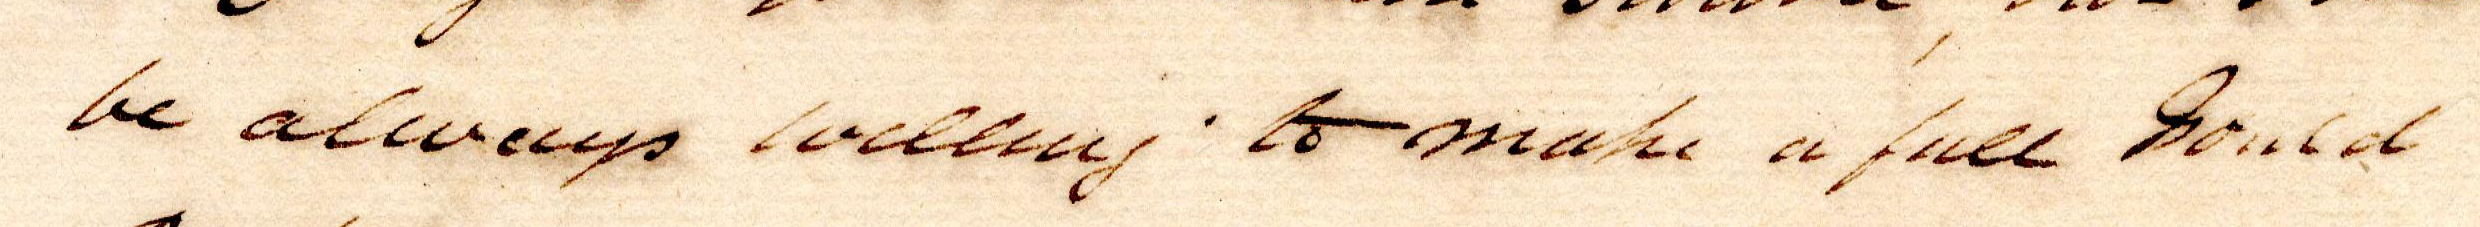be always willing to make a full Fould
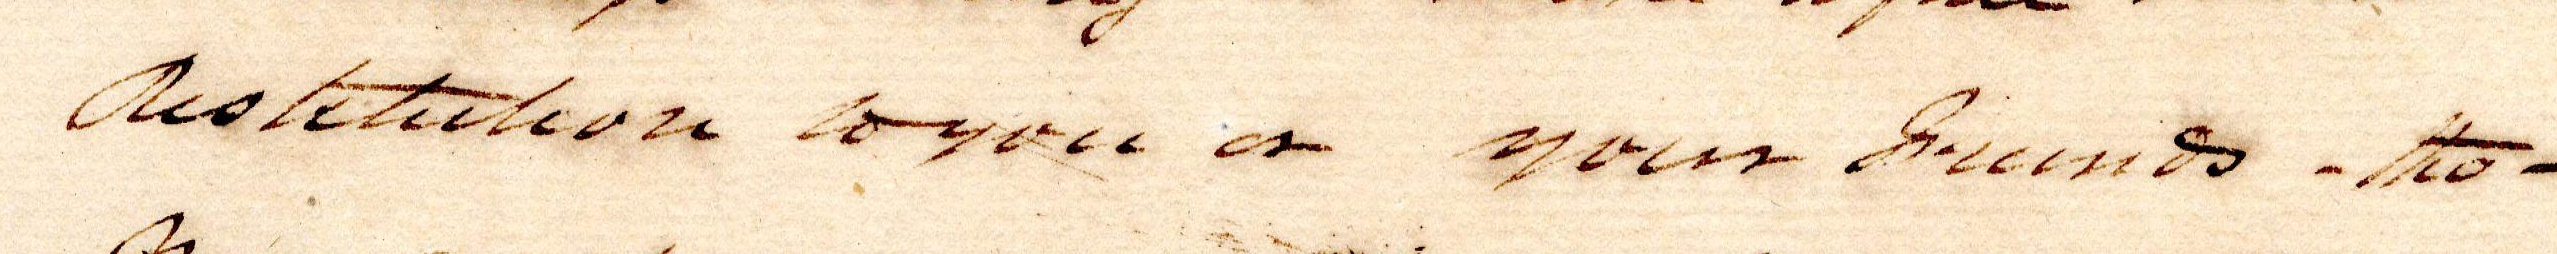Restitution to you or your Friends- tho
